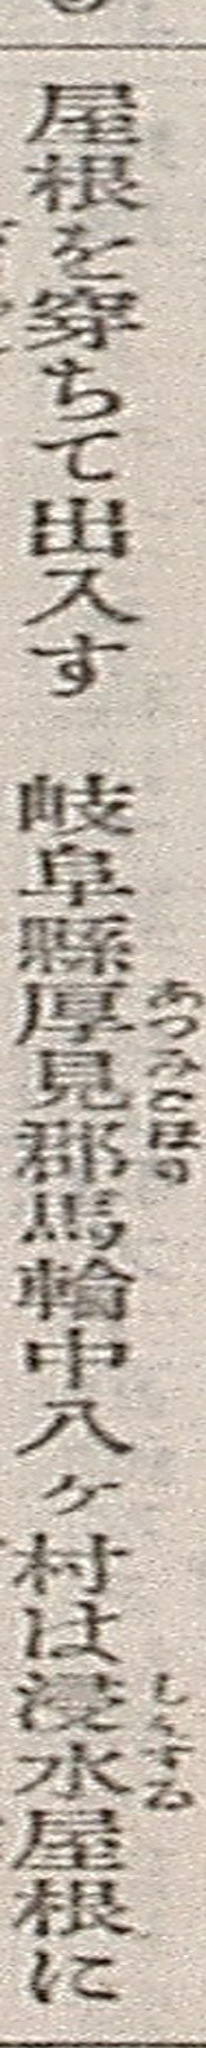屋根を穿ちて出入す岐阜県厚見郡馬輪中八ヶ村は浸水屋根に
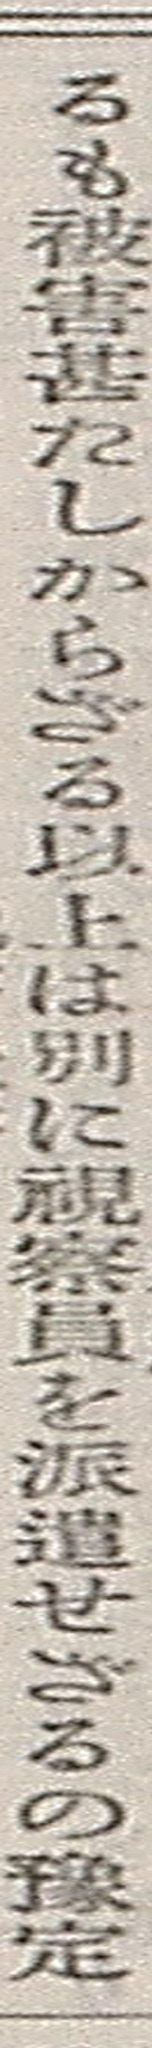るも被害甚だしからざる以上は別に視察員を派遣せざるの予定
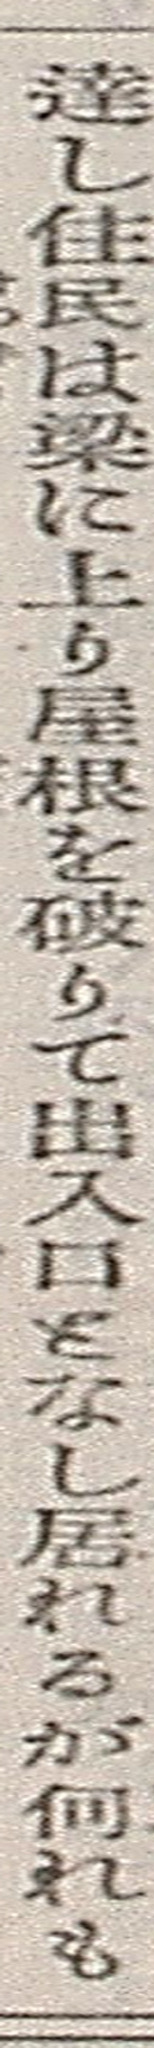達し住民は梁に上り屋根を破りて出入口となし居れるが何れも
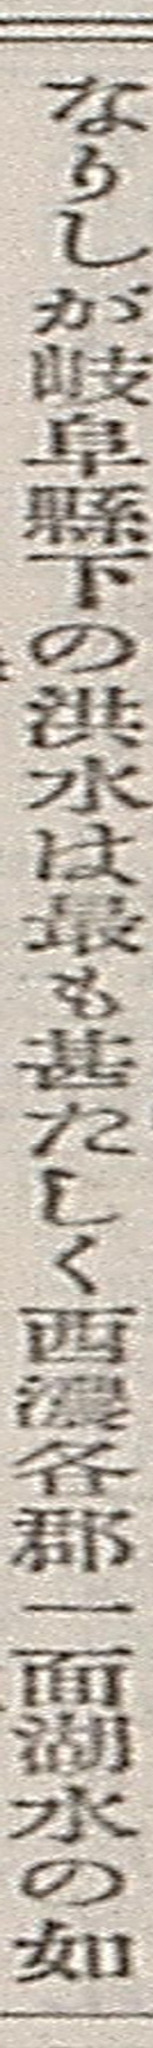なりしが岐阜県下の洪水は最も甚だしく西濃各郡一面湖水の如
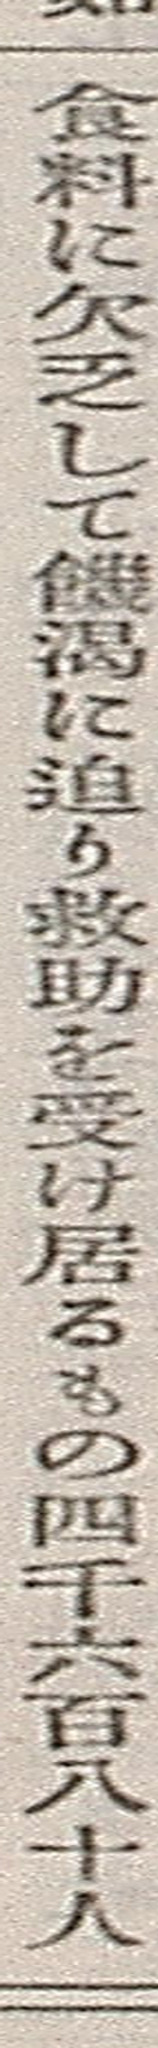食料に欠乏して飢渇に迫り救助を受け居るもの四千六百八十人
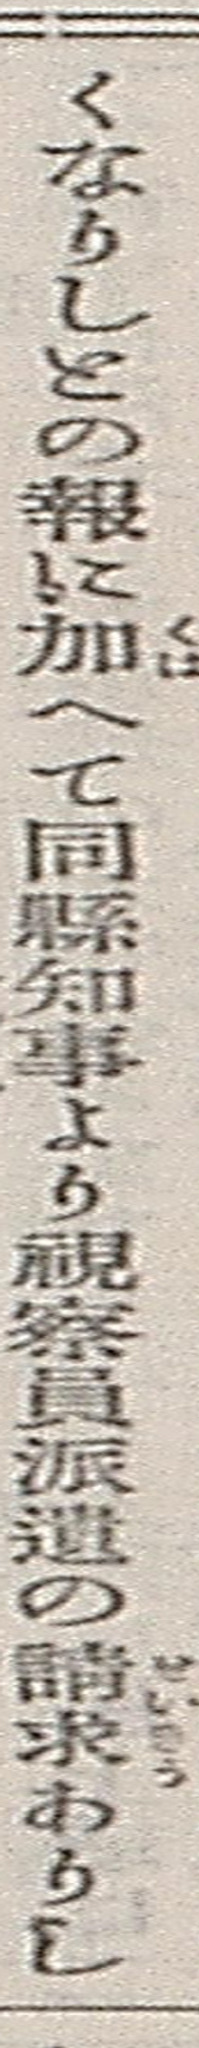くなりしとの報に加へて同縣知事より視察員派遣の請求ありし
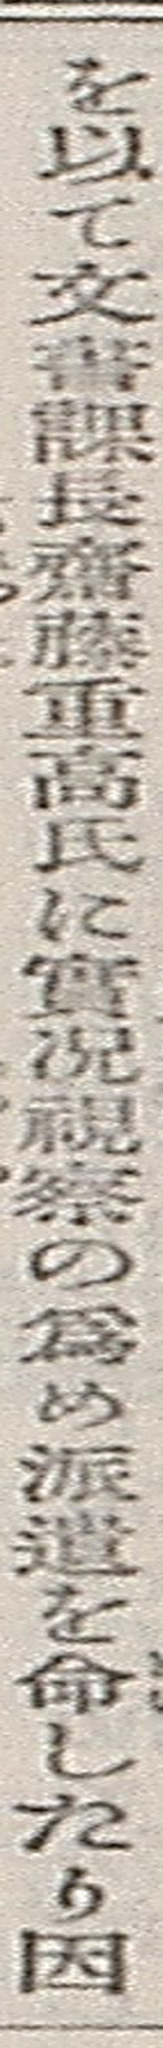を以て文書課長斉藤重高に実況視察の為め派遣を命じたり因
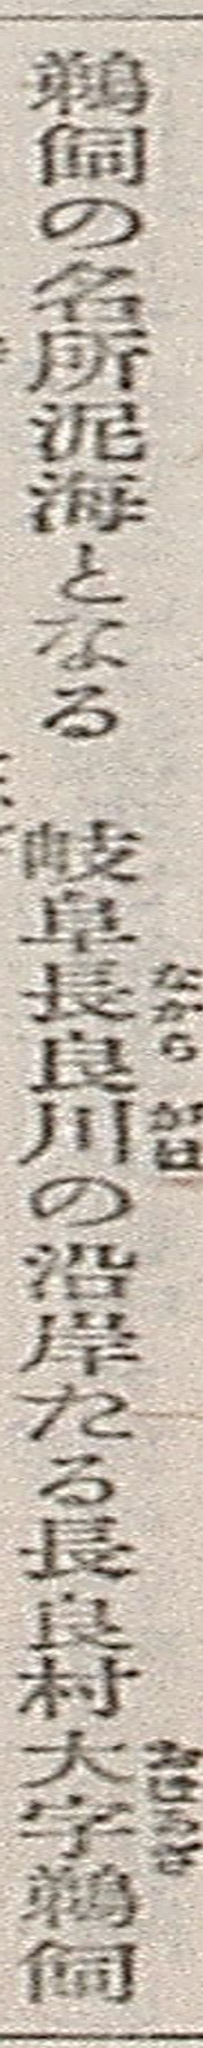鵜飼の名所泥海となる岐阜長良川の沿岸たる長良村大字鵜飼
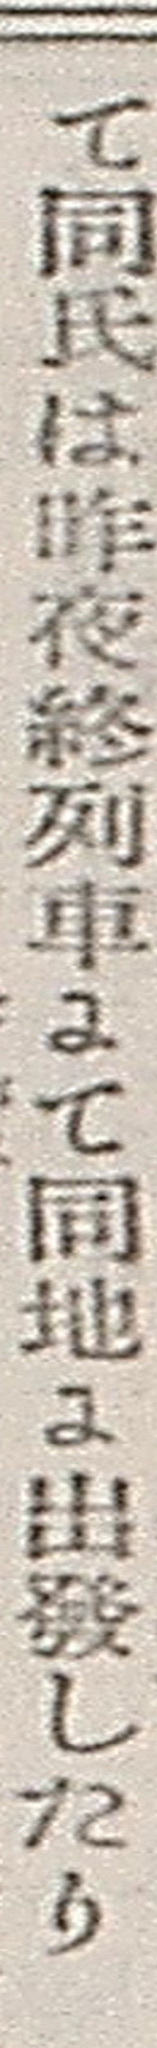て同氏は昨夜終列車にて同地に出発したり
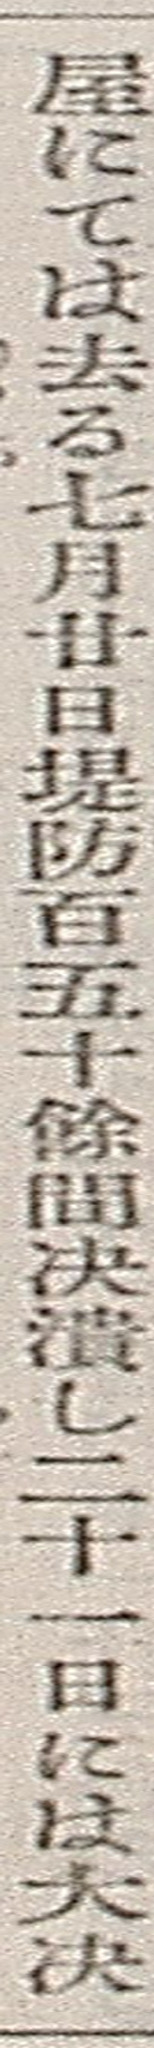屋にては去る七月廿日堤防百五十餘間决潰二十一日には大决
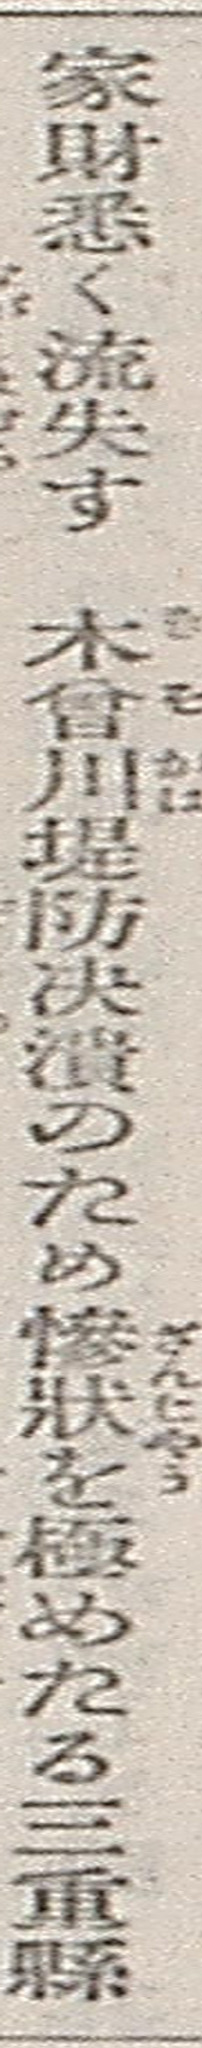家財悉く流失す木曽川堤防决潰のため惨状を極めたる三重県
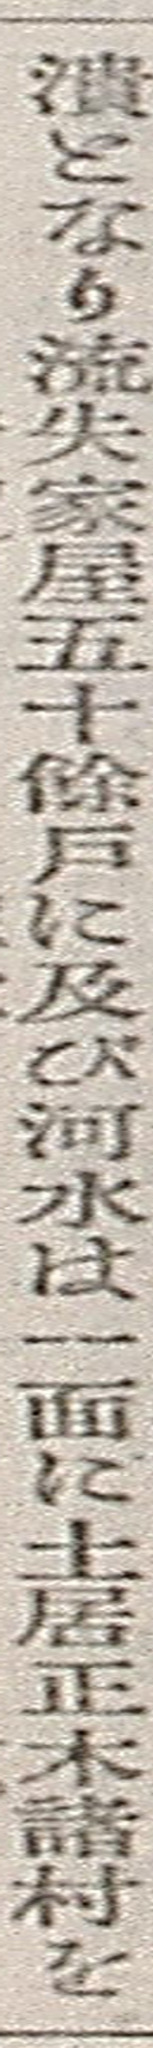潰となり流失家屋五十餘戸に及び河水は一面に土居正木諸村を
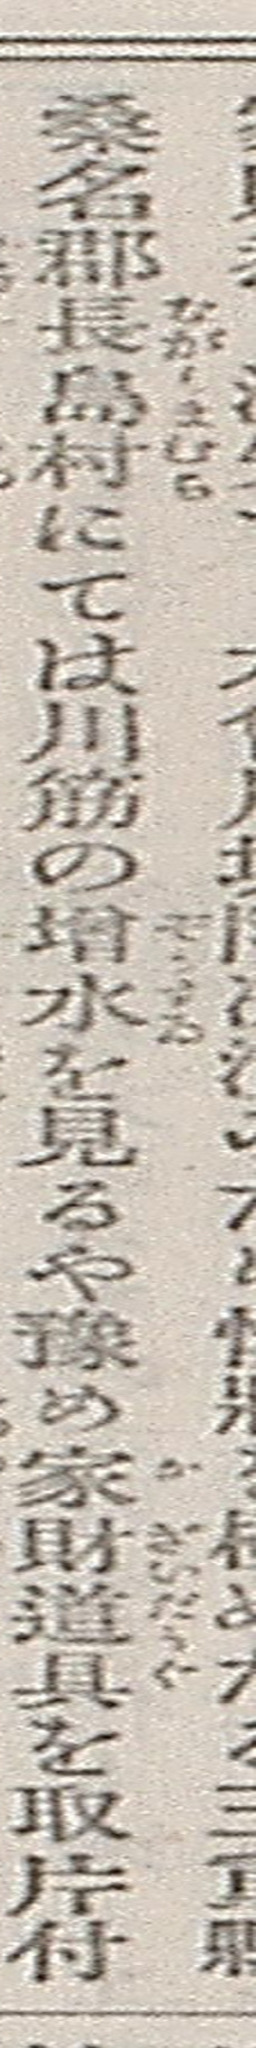桑名郡長島村にては川筋の増水を見るや豫め家財道具を取片付
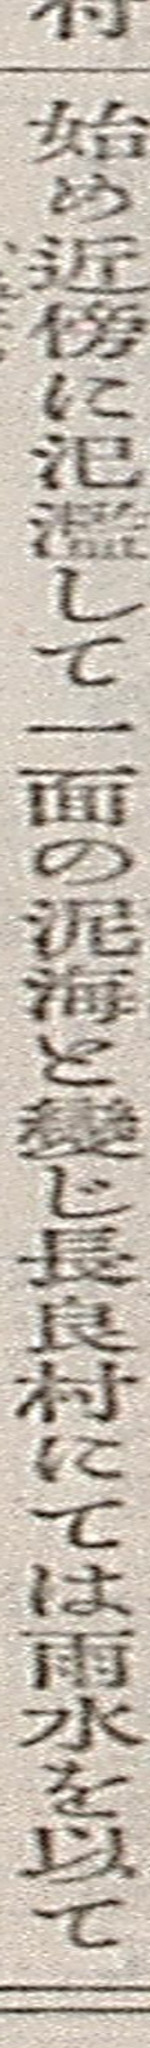初め近傍に氾濫して一面の泥海と変じ長良村にては雨水を以て
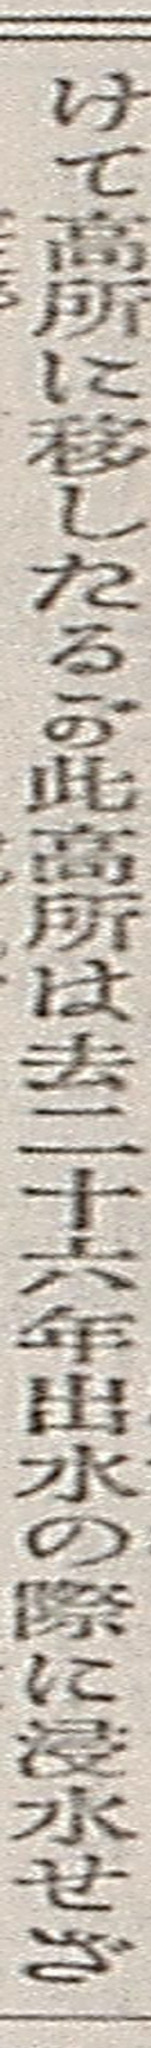けて高所に移したるが此高所は去二十六年出水の際に浸水せざ
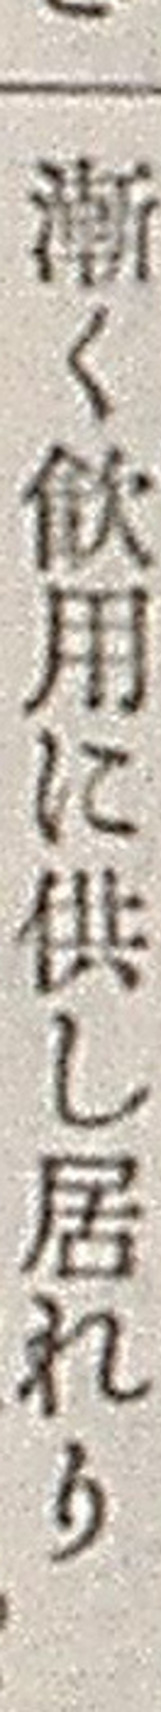漸く飲用に供し居れり
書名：風俗畫報臨時増刊第百二十六號　洪水被害録（中）
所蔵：東京大学地震研究所図書室 Earthquake Research Institute Library, The University of Tokyo, JAPAN
